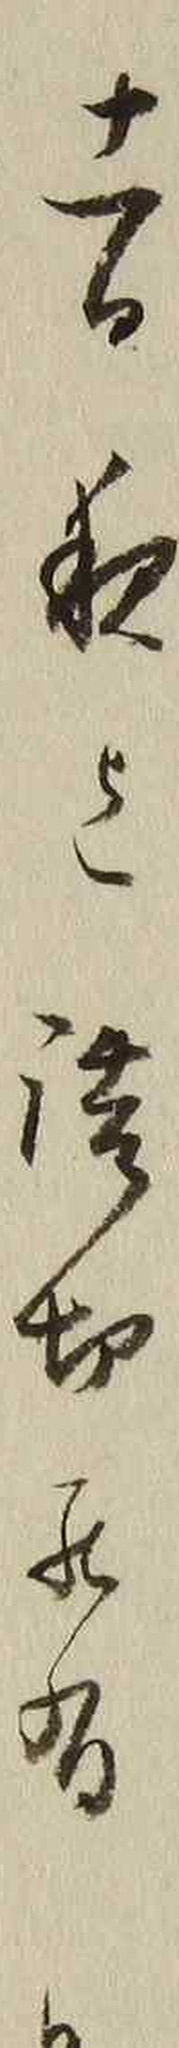十一日夜迄詰切罷有候
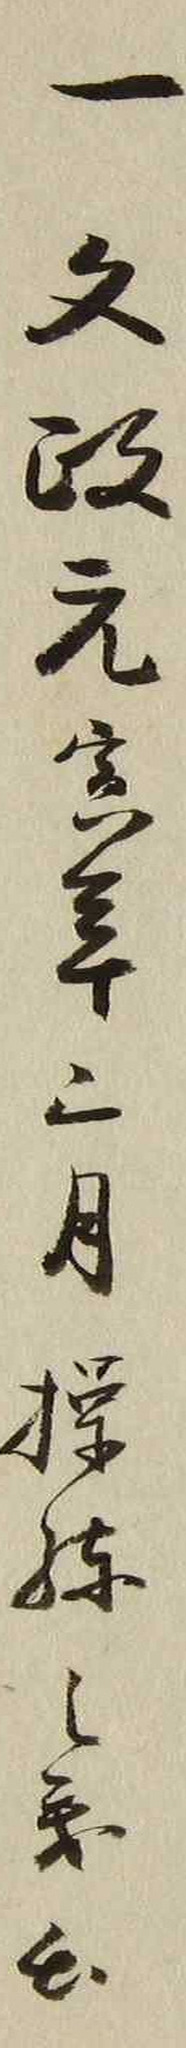一文政元寅年三月操練之義出
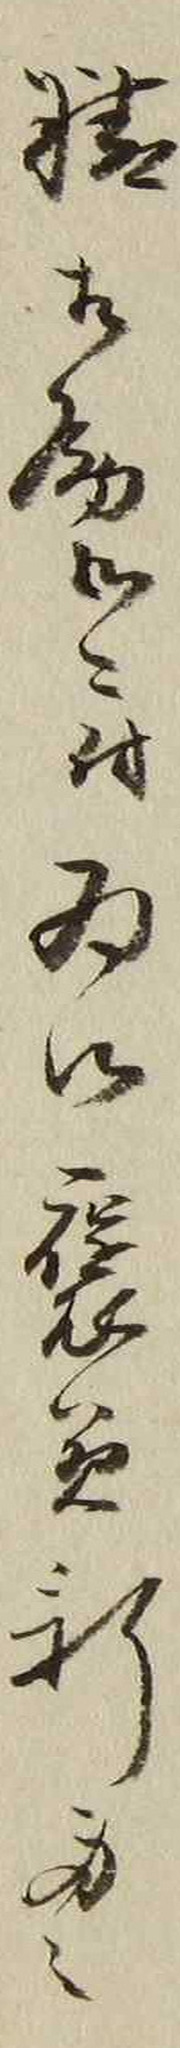精相励候ニ付為御褒美新身之
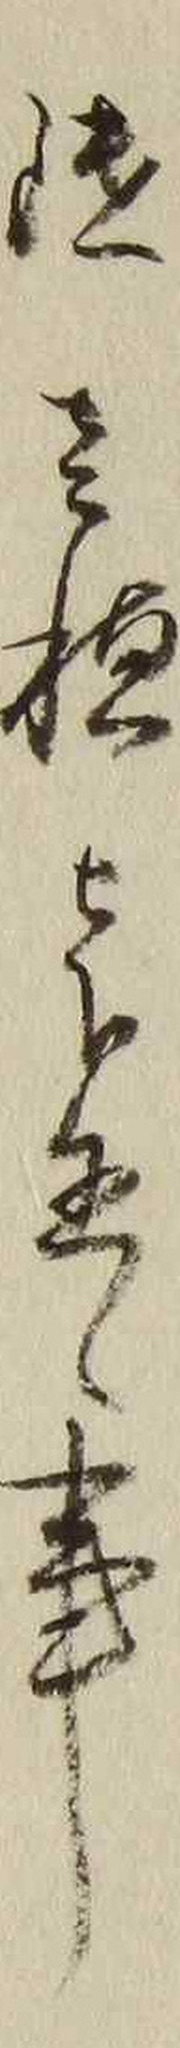鑓壱穂被下置候事
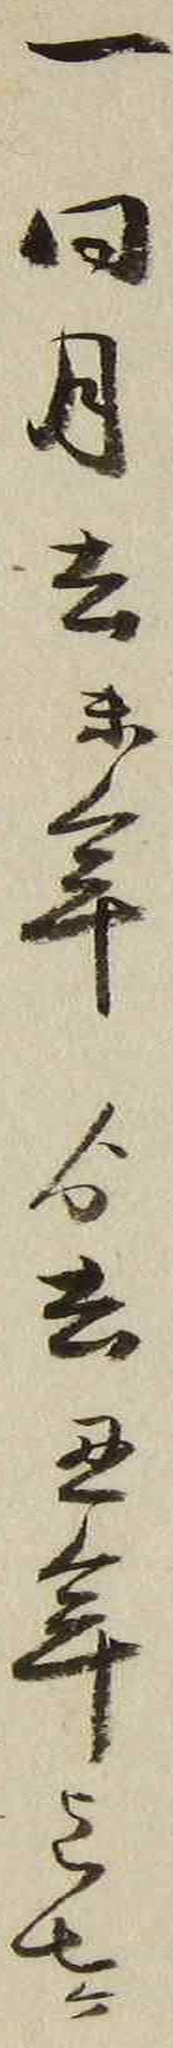一同月去未年ゟ去丑年迄七ヶ
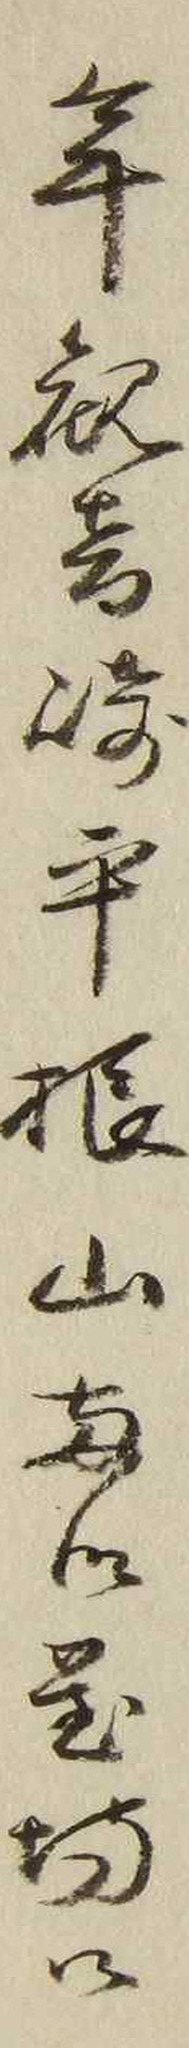年観音崎平根山両御台場御

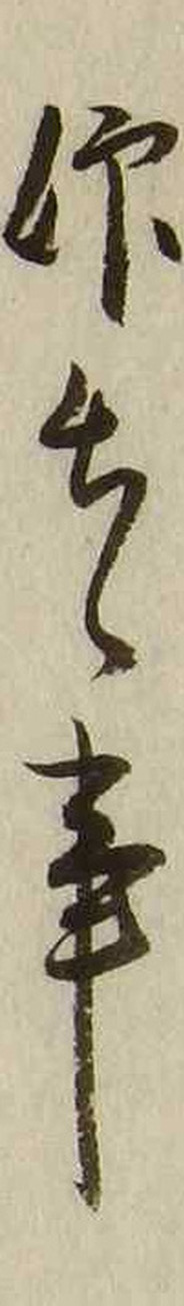仰出候事
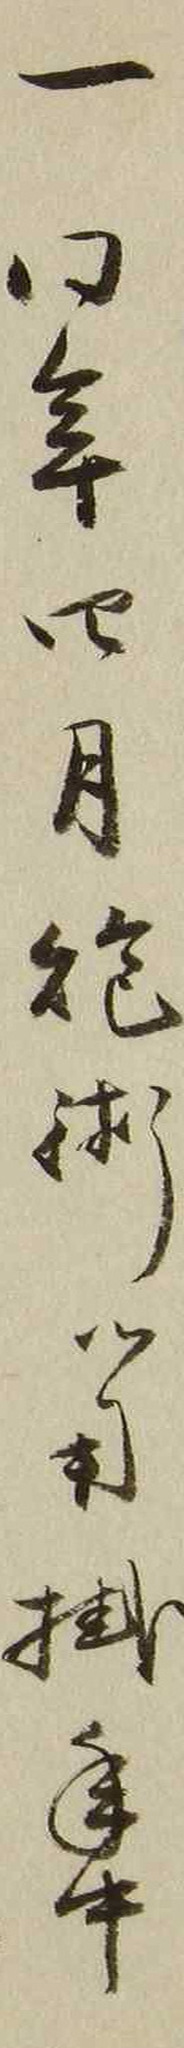一同年四月砲術御用掛年中
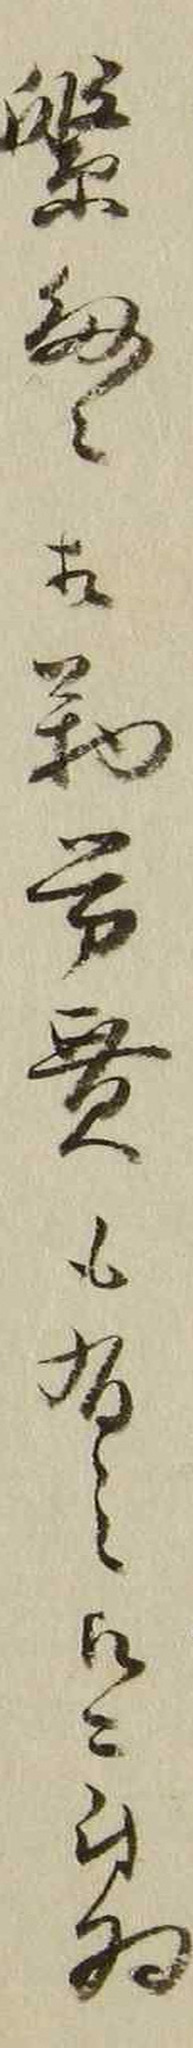繁多ニ相勤労費も有之候ニ付為
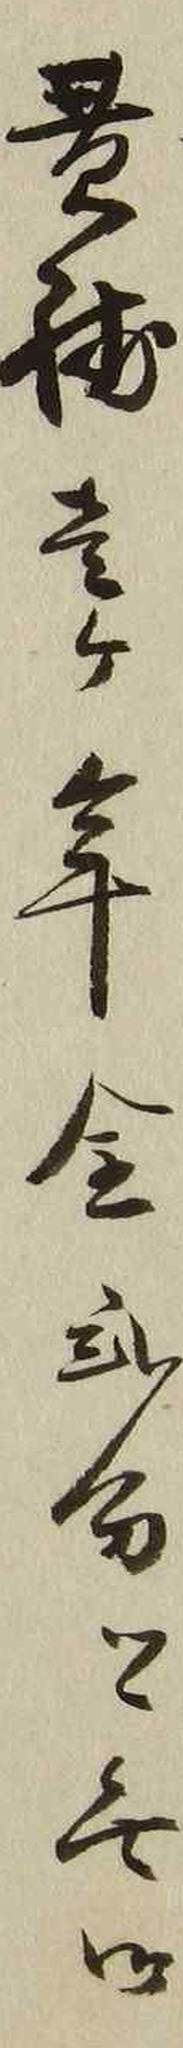費補壱ヶ年金弐分ツヽ無御
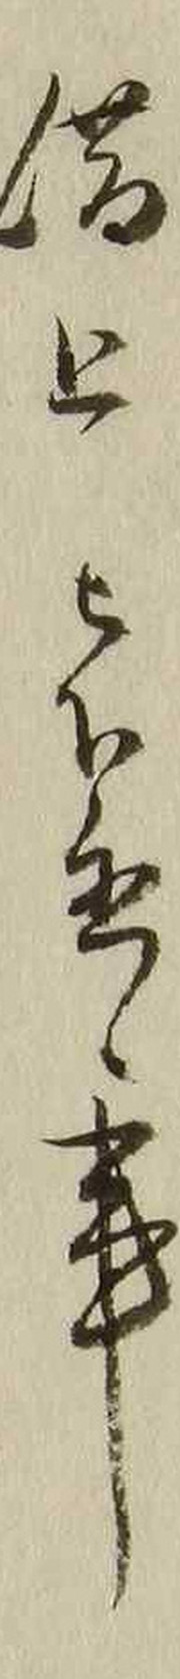借上被下置候事
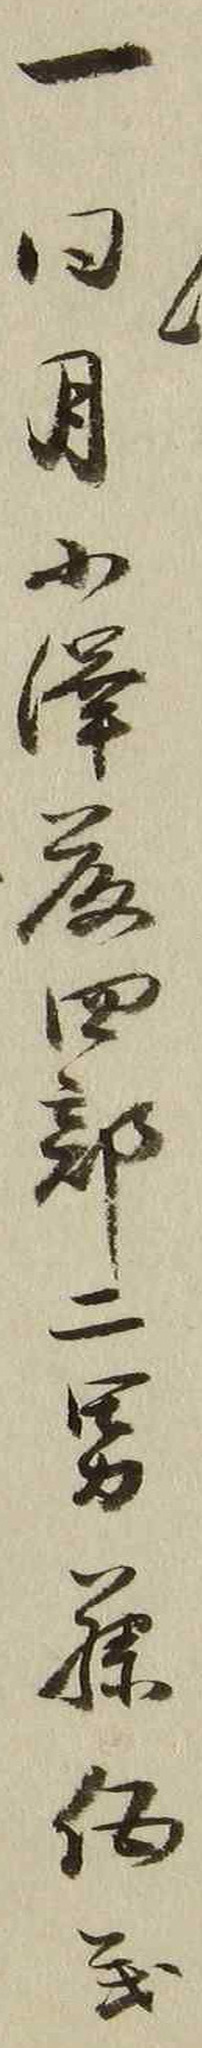一同月小沢藤四郎二男藤伍義
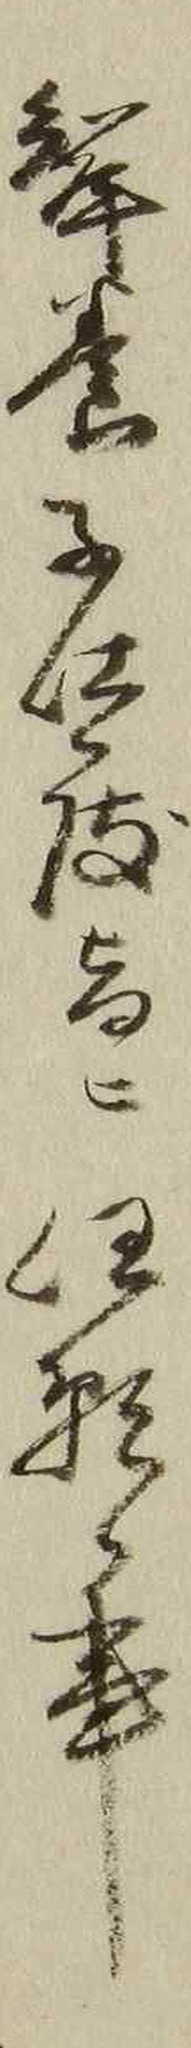聟養子仕度旨被任願候事
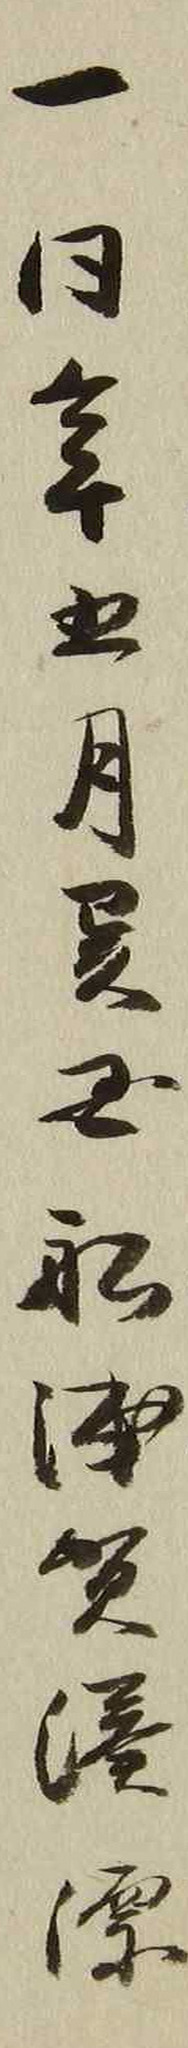一同年五月異国船浦賀湊漂
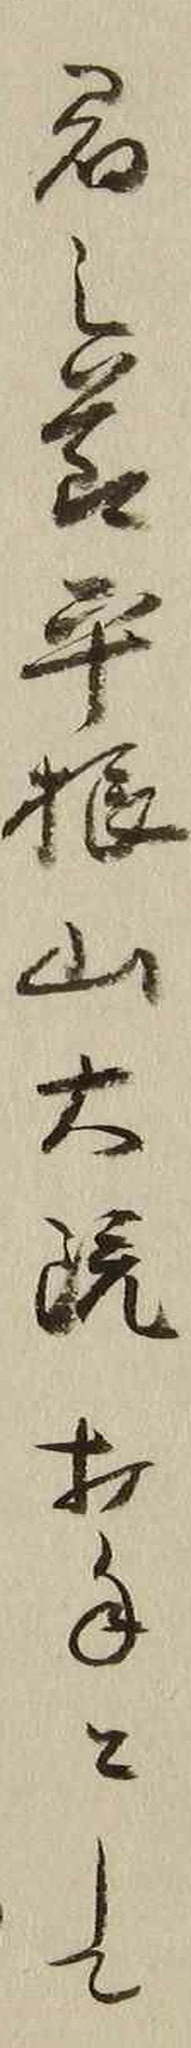着之節平根山大銃打手として
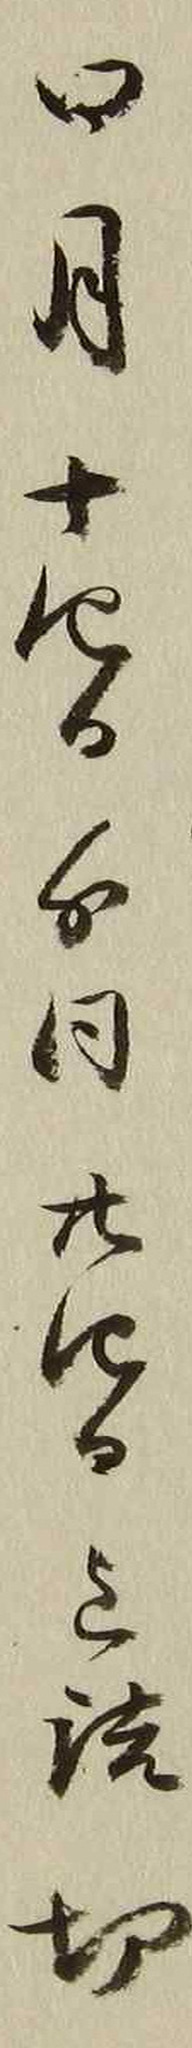同月十四日ゟ同廿四日迄詰切
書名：諸士系譜　巻之288　さ之部20
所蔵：会津若松市立会津図書館
